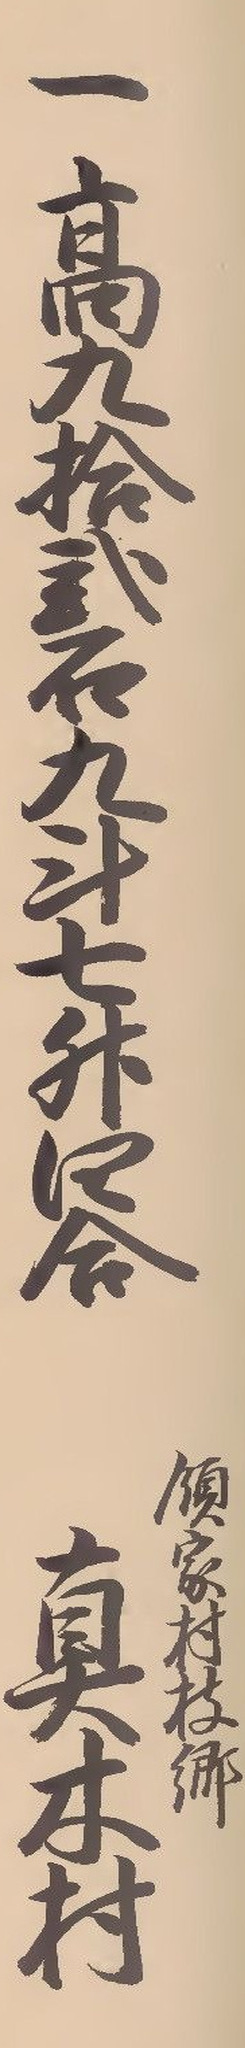一髙九拾弐石九斗七升四合真木村
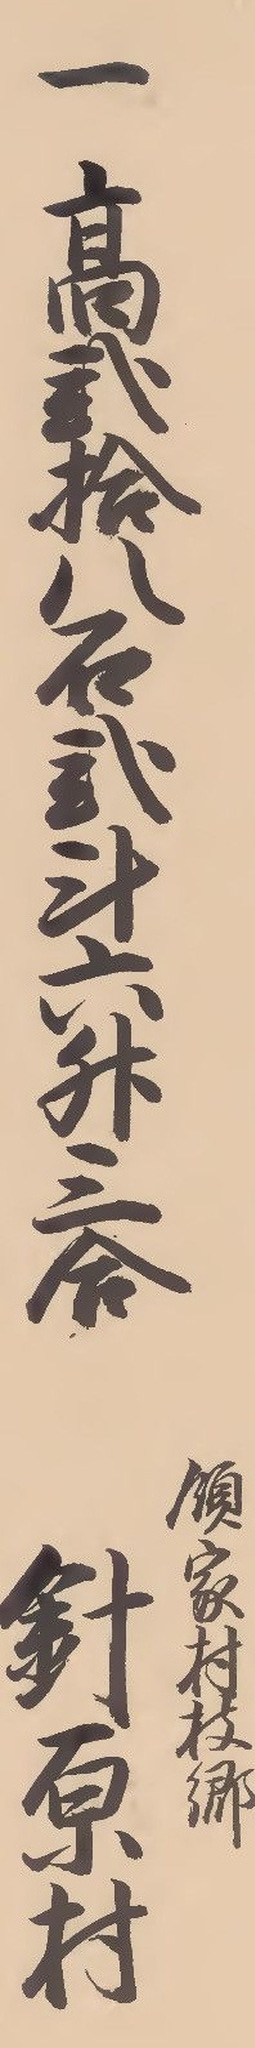一髙弐拾八石弐斗六升三合針原村
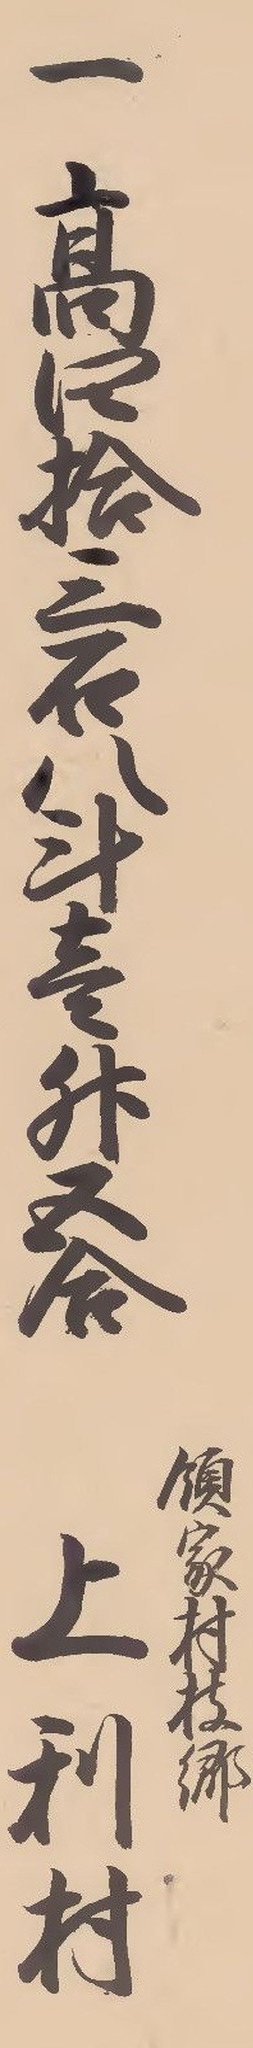一髙四拾三石八斗壱升五合上利村

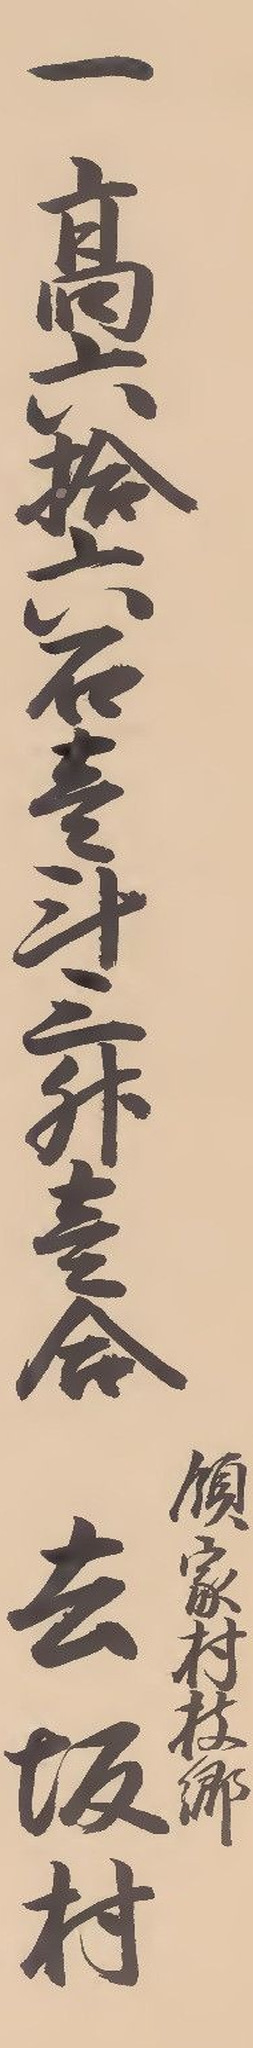一髙六拾六石壱斗三升壱合去坂村
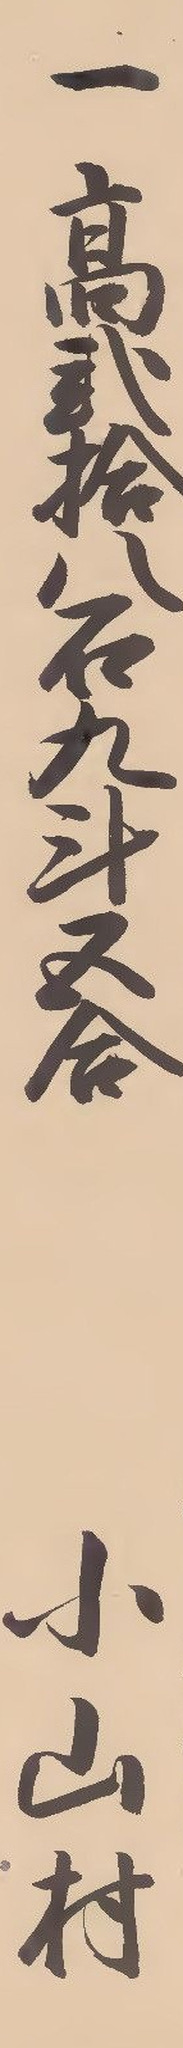一髙弐拾八石九斗五合小山村
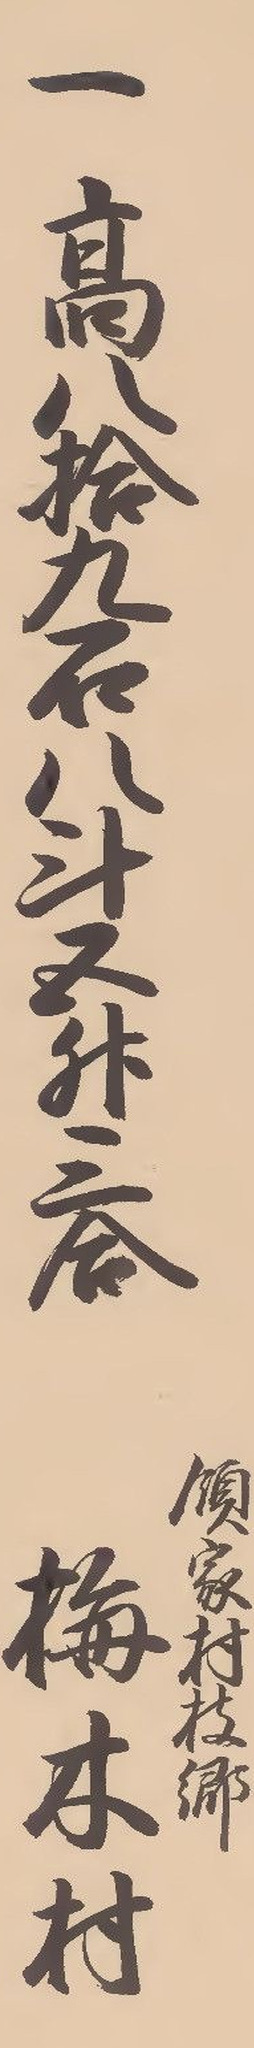一髙八拾九石八斗五升三合梅木村
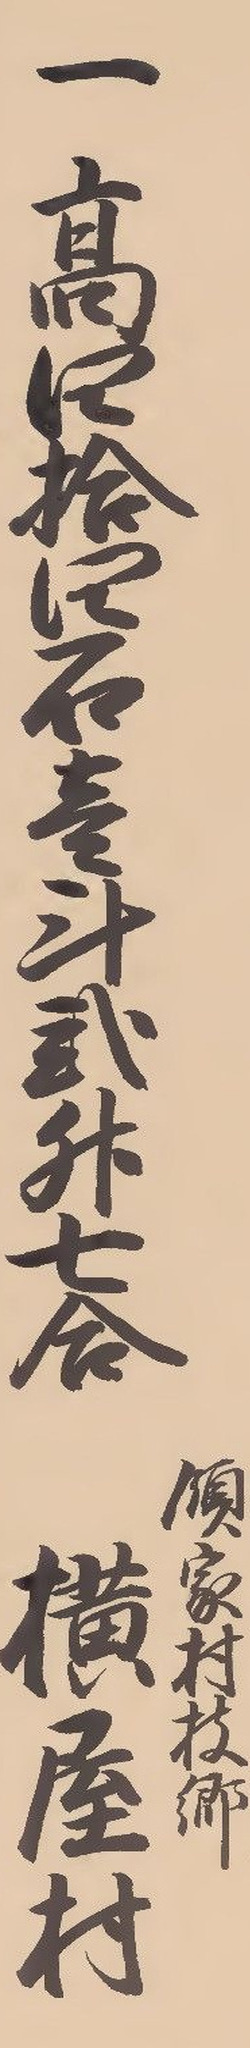一髙四拾四石壱斗弐升七合横屋村
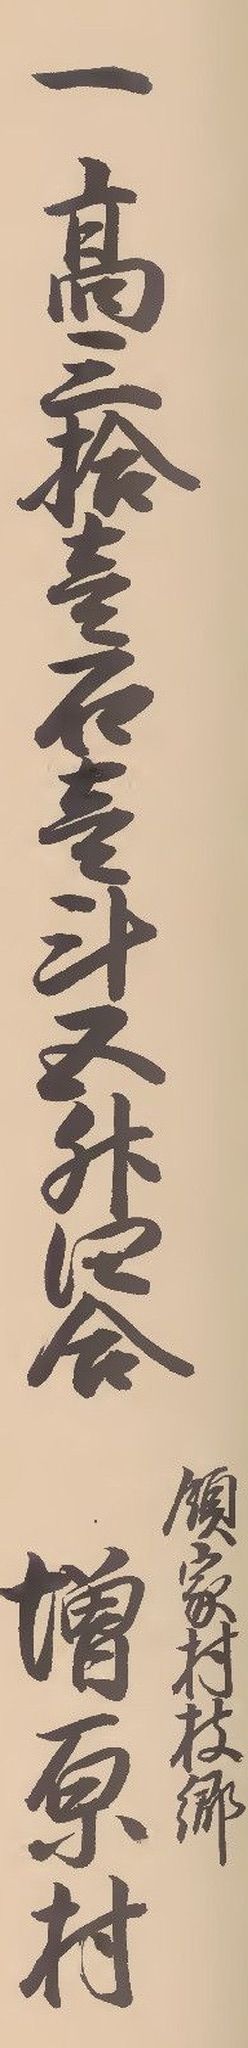一髙三拾壱石壱斗五升四合増原村
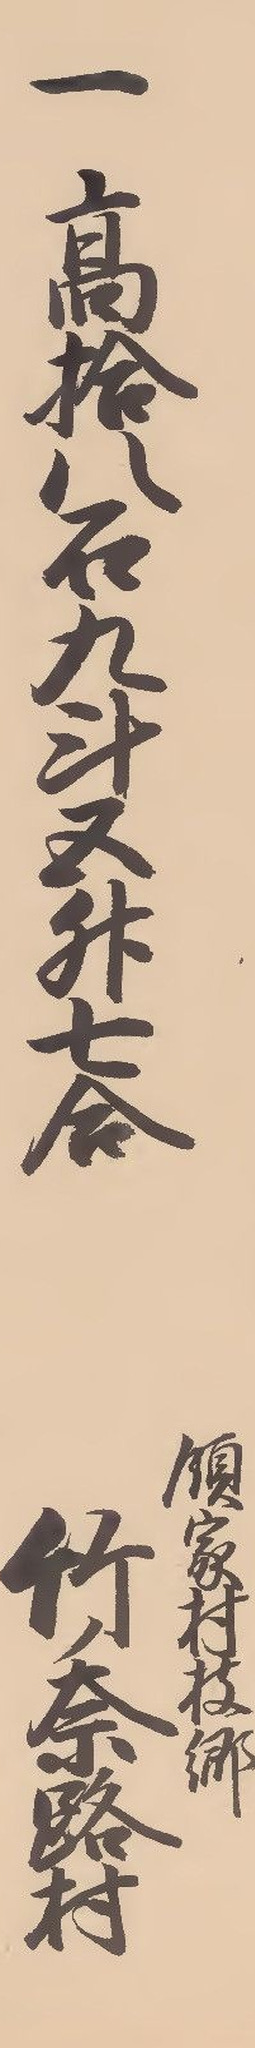一髙拾八石九斗五升七合竹ノ奈路村
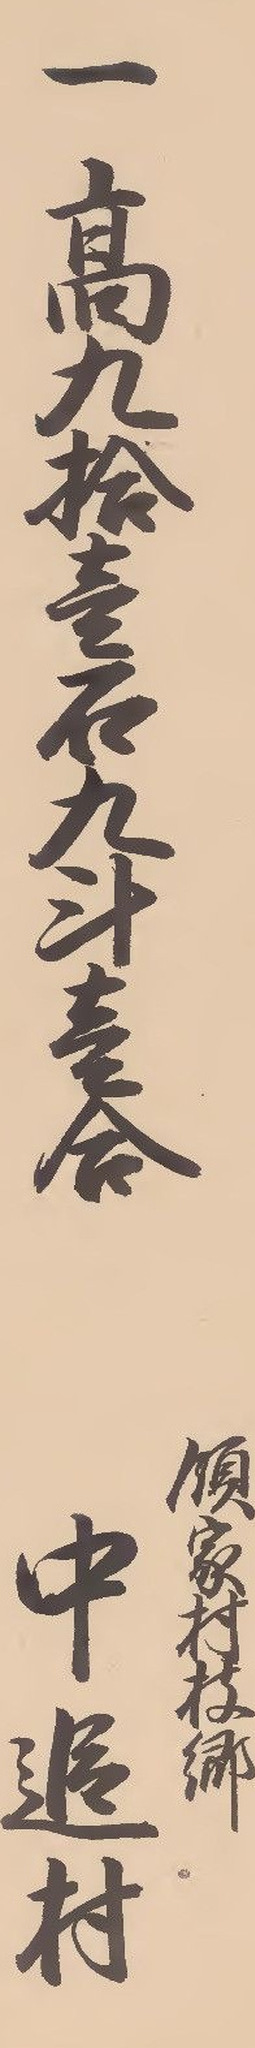一髙九拾壱石九斗壱合中追村
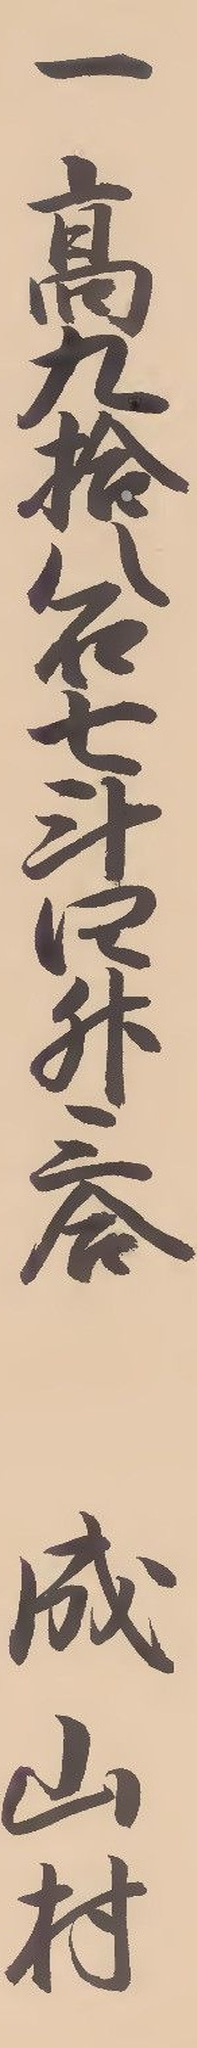一髙九拾八石七斗四升三合成山村

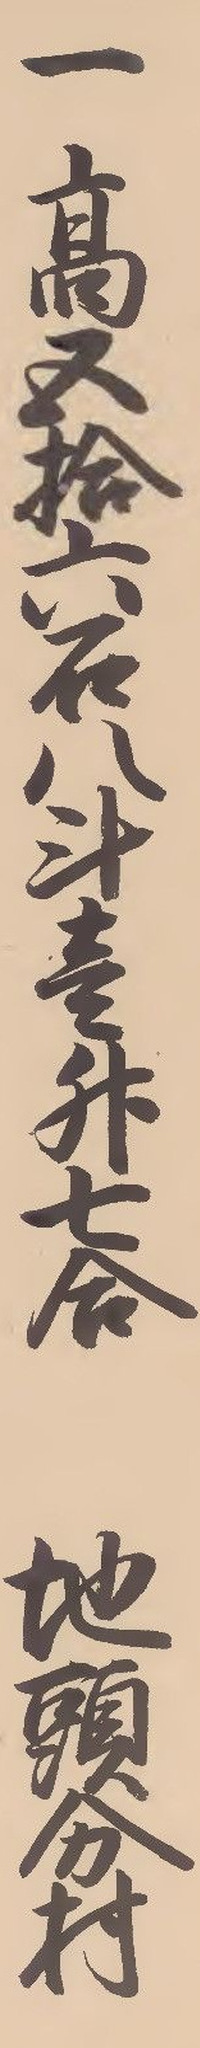一髙五拾六石八斗壱升七合地頭分村
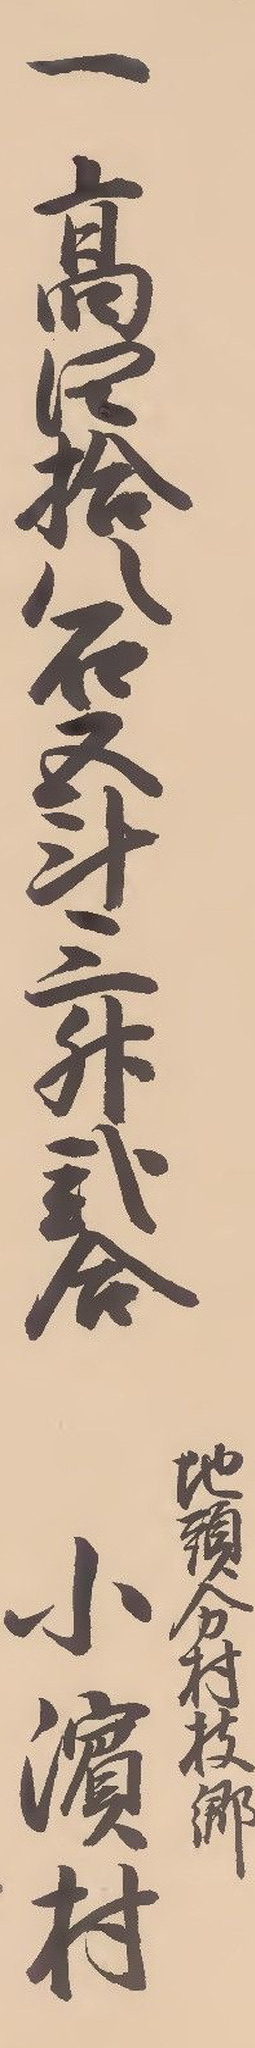一髙四拾八石五斗三升弐合小濱村
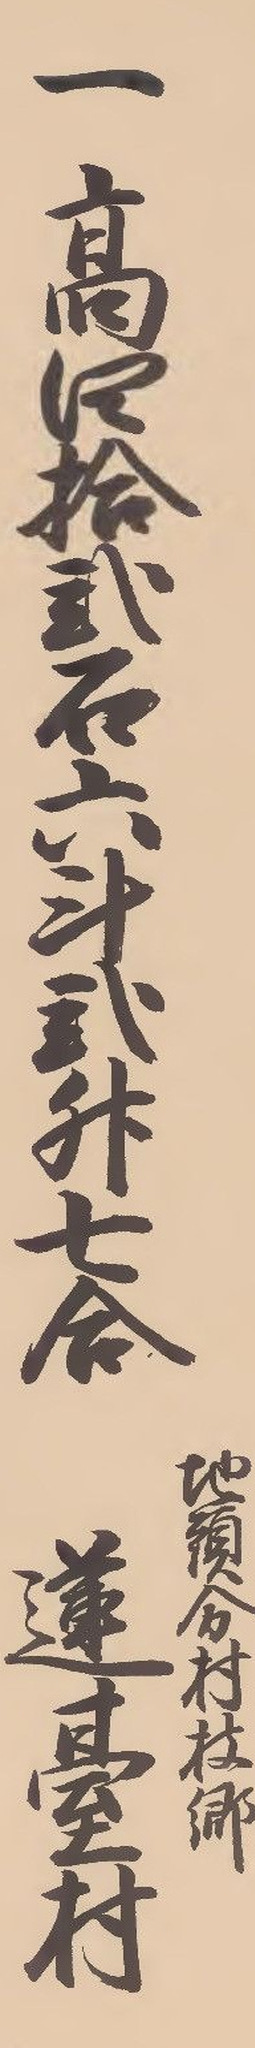一髙四拾弐石六斗弐升七合蓮臺村
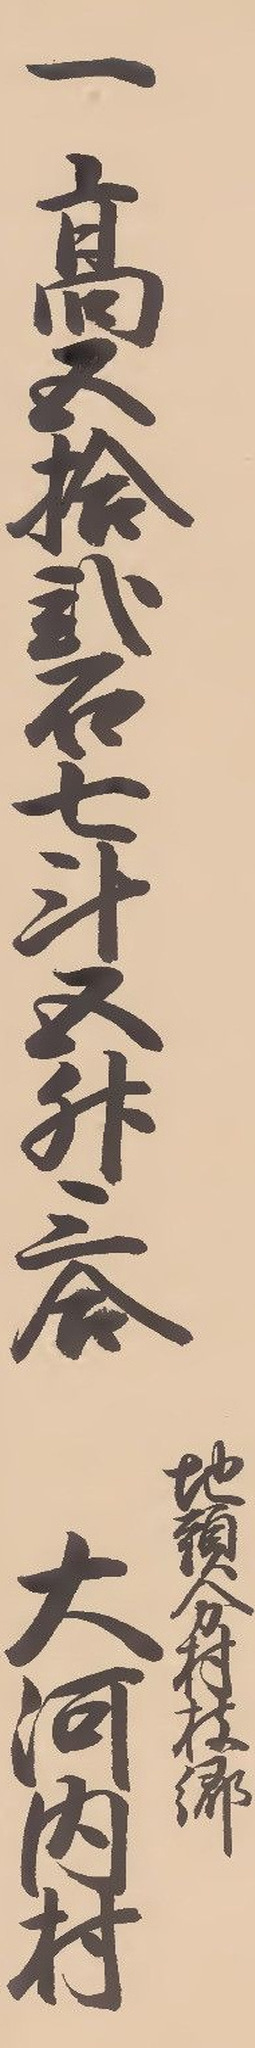一髙五拾弐石七斗五升三合大河内村
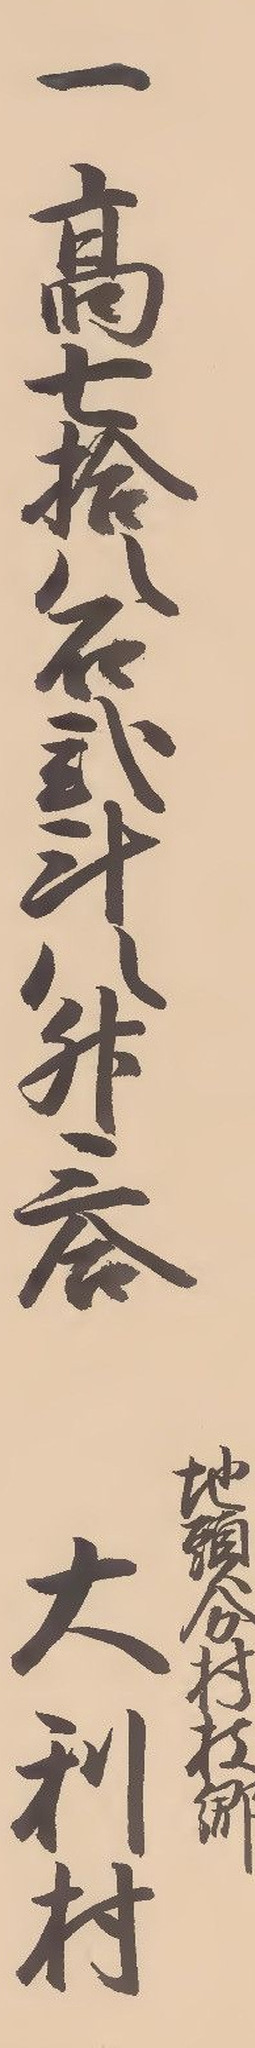一髙七拾八石弐斗八升三合大利村
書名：土佐国郷帳
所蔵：国立公文書館 National Archives of Japan
